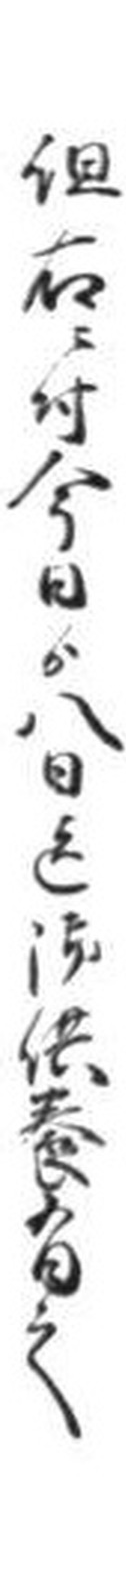但右ニ付今日ゟ八日迄御供養有之
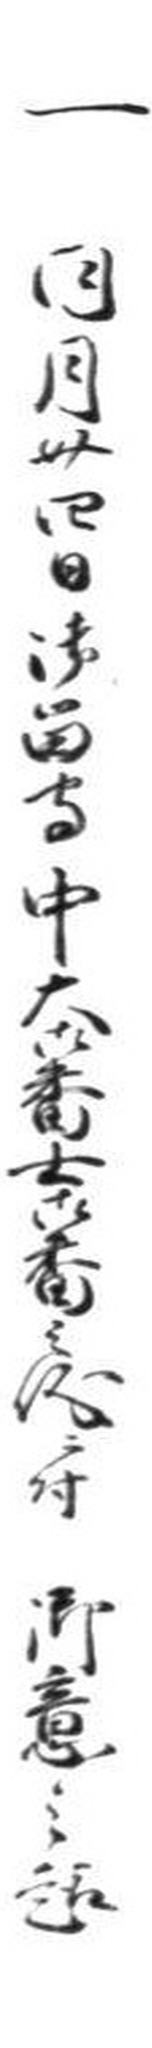一同月廿四日御留守中大御番士御番之儀ニ付御意之趣
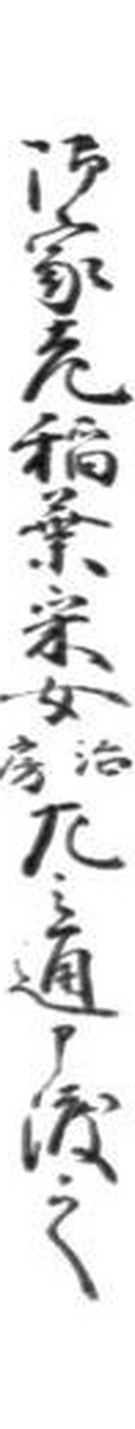御家老稲葉采女治房左之通申渡之
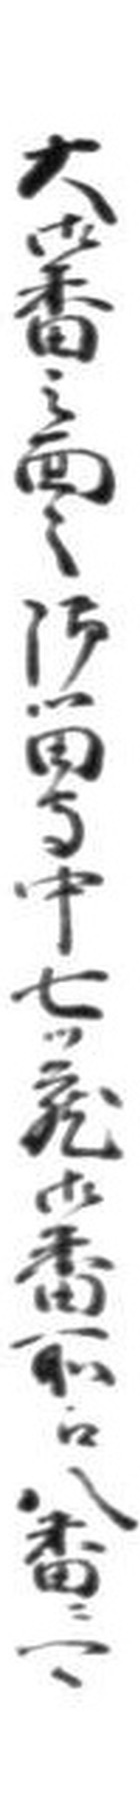大御番之面々御留守中七ツ蔵御番所江八番ニ可
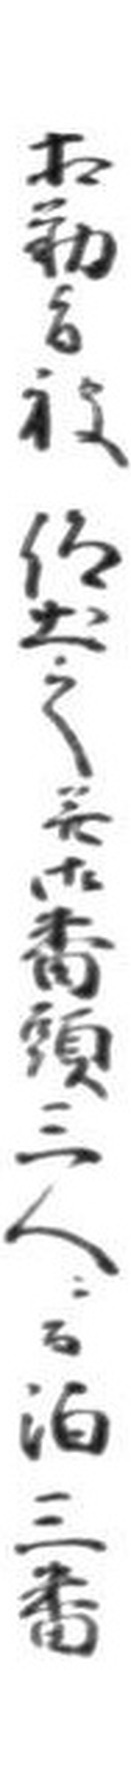相勤旨被仰出之并御番頭三人ニ而泊三番
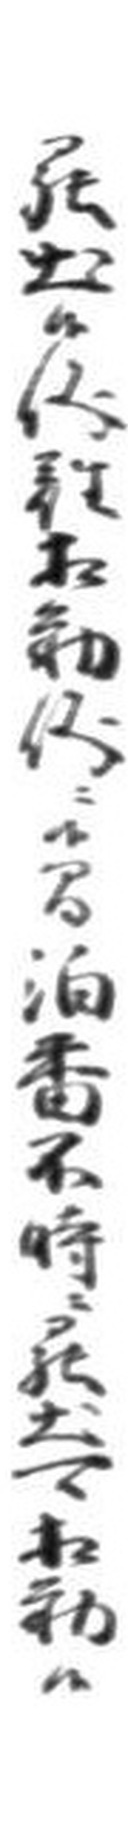罷出候儀難相勤儀ニ候間泊番不時ニ罷出可相勤候
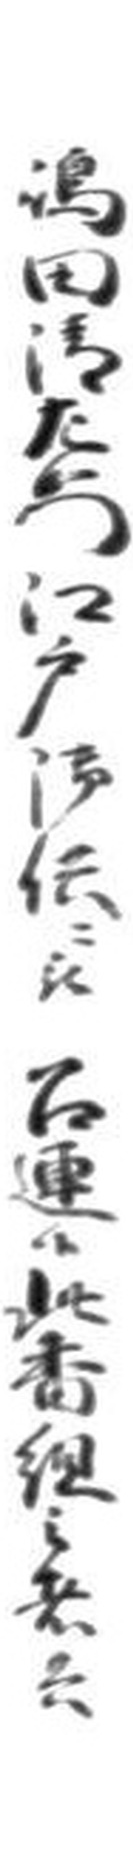嶋田清左衛門江戸御供ニ被召連候此番組之者共
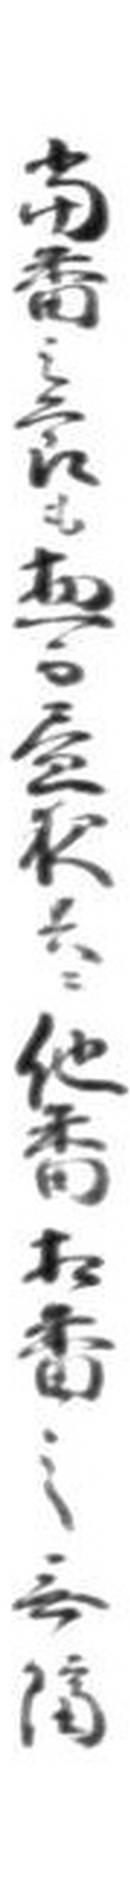当番之節も惣而昼夜共ニ他番相番之無隔
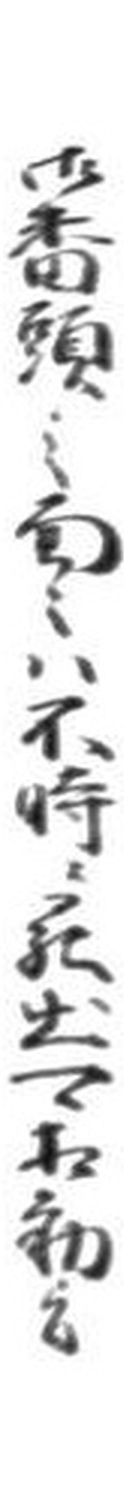御番頭之面々ハ不時ニ罷出可相勤旨
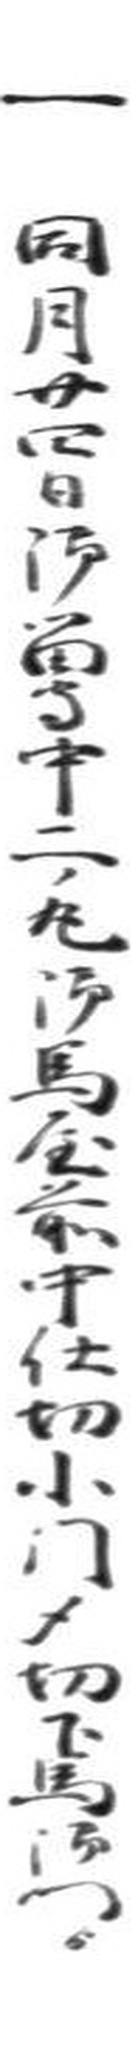一同月廿四日御留守中二ノ丸御馬屋前中仕切小門〆切下馬御門ゟ

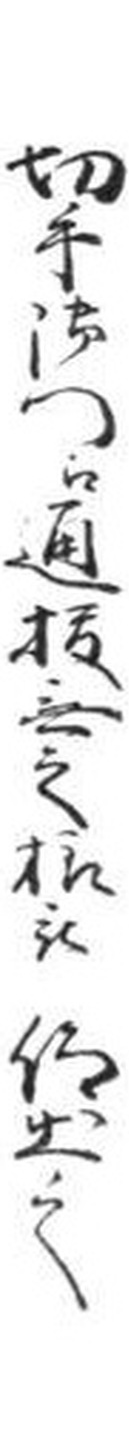切手御門江通抜無之様被仰出之
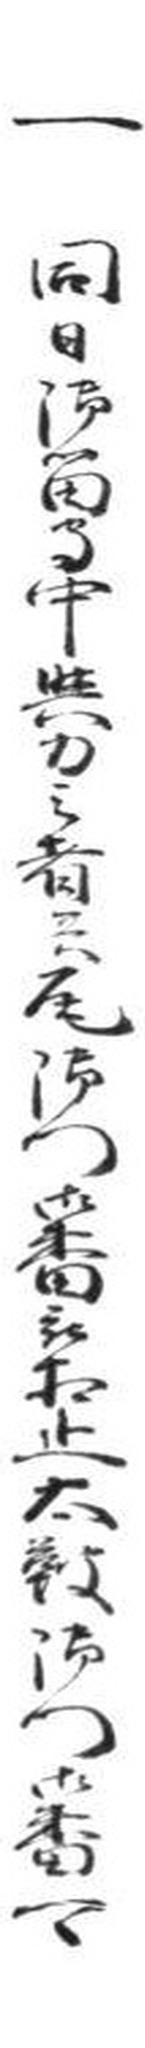一同日御留守中与力之者共瓦御門御番被相止太鼓御門御番可
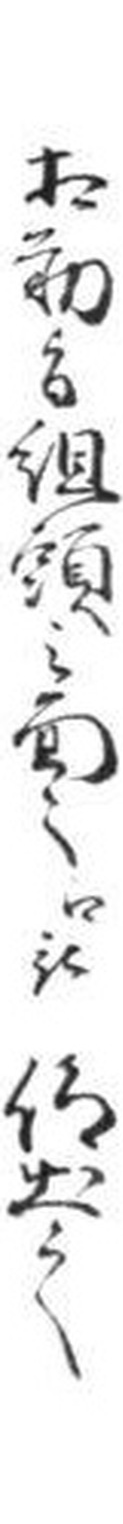相勤旨組頭之面々江被仰出之
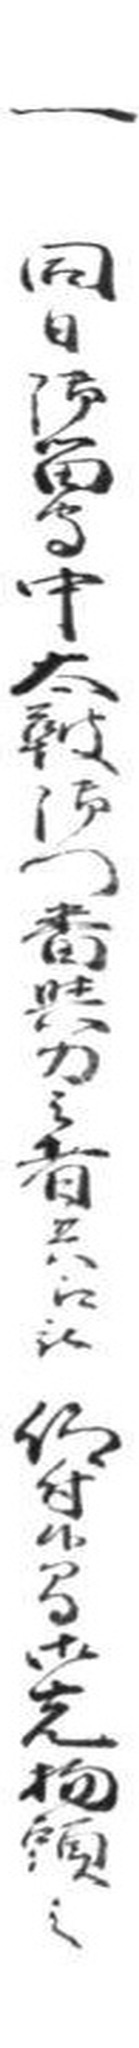一同日御留守中太鼓御門番与力之者共江被仰付候間御先物頭之
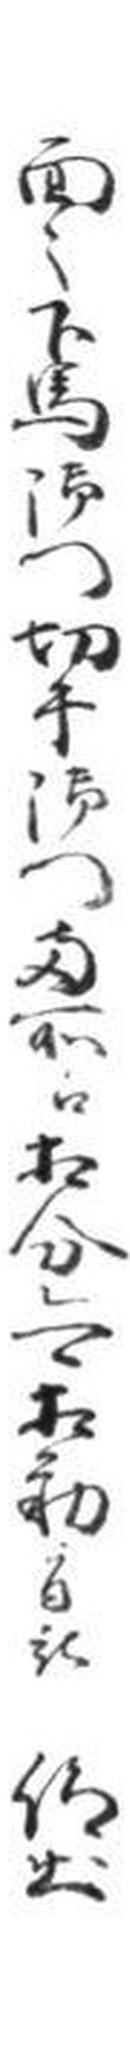面々下馬御門切手御門両所江相分レ可相勤旨被仰出
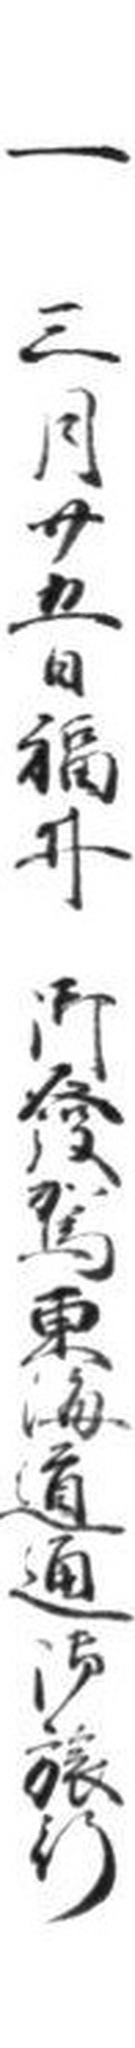一三月廿五日福井御発駕東海道通御旅行
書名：家譜 十七 吉品公 従元禄元年到同二年
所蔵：福井県文書館 Fukui Prefectural Archives
